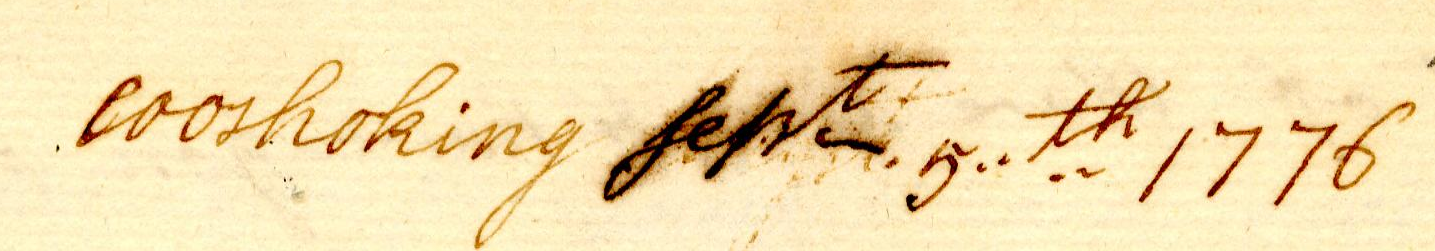Cooshoking Sep^t. 5^th. 1776
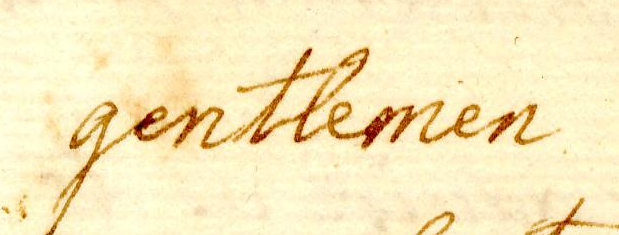gentlemen
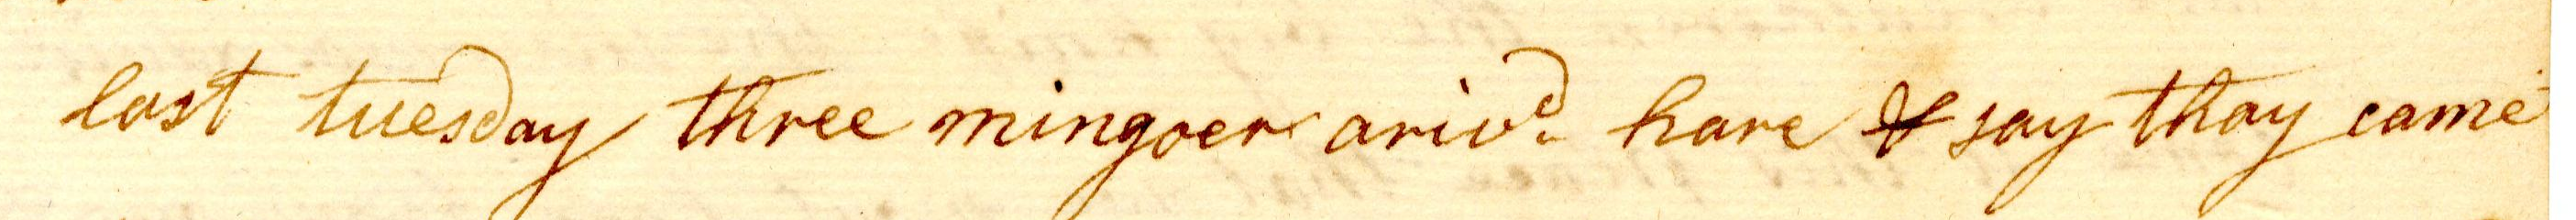last tuesday three mingoes ariv^d. hare & say thay came
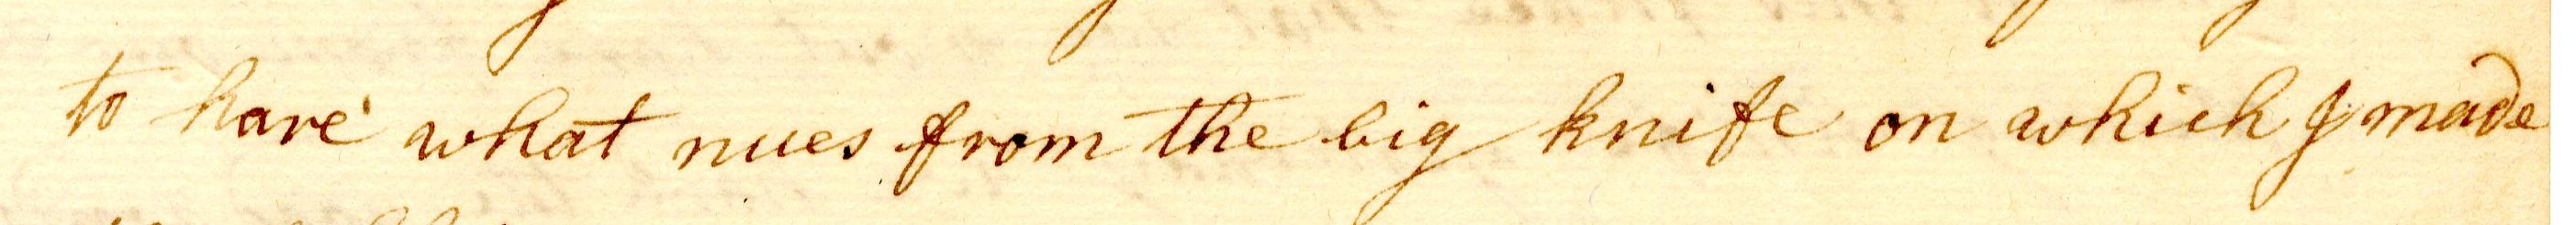to have what nues from the big knife on which I made
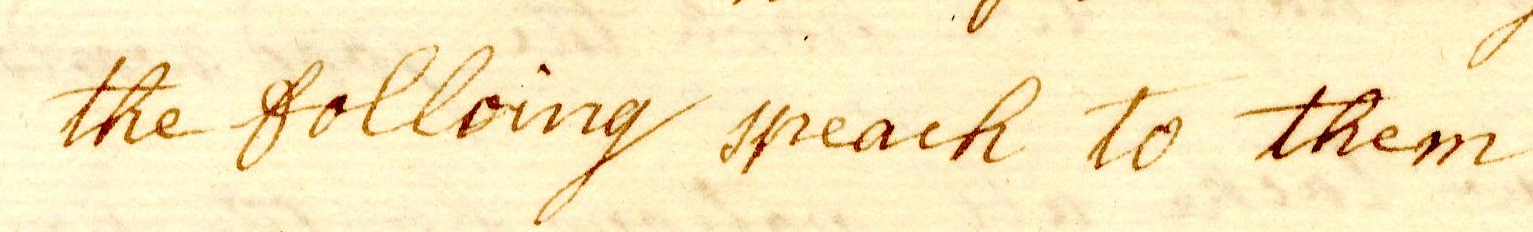the folloing speach to them
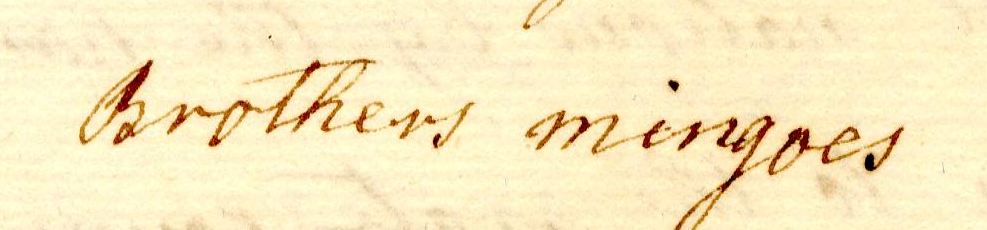Brothers mingoes
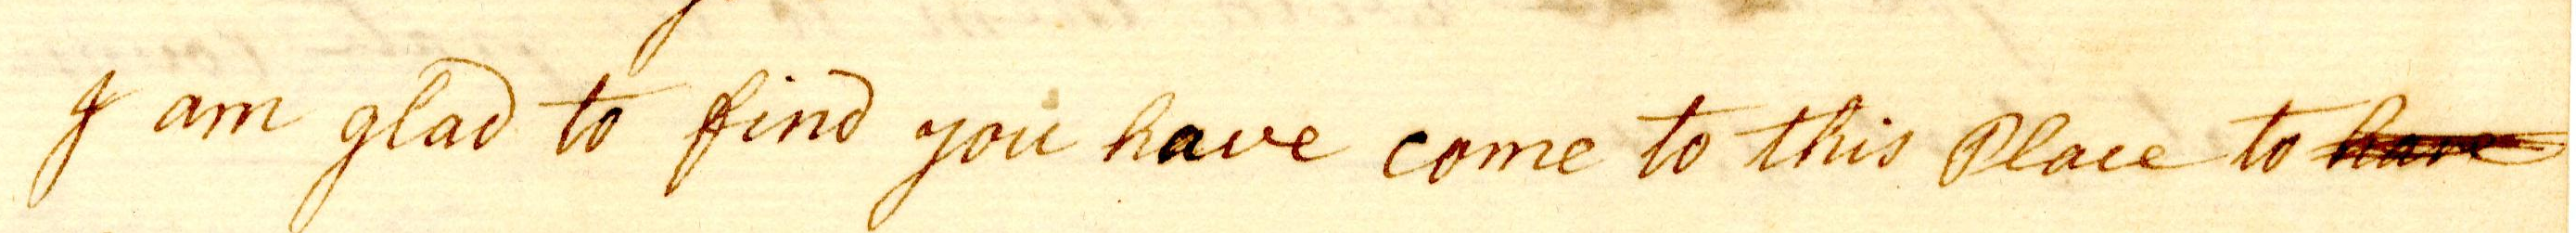I am glad to find you have come to this Place to [have]
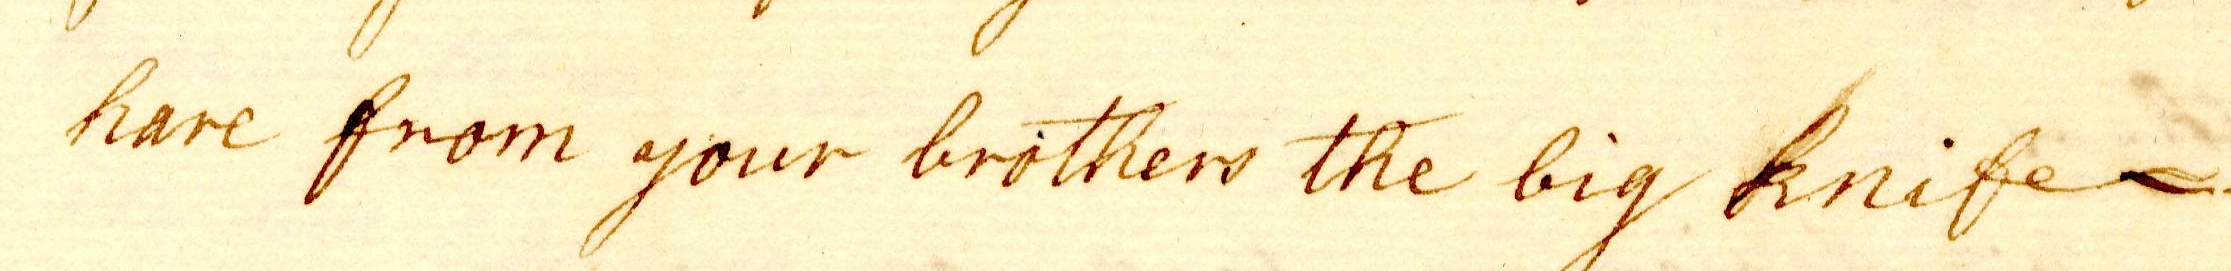hare from your brothers the big knife-
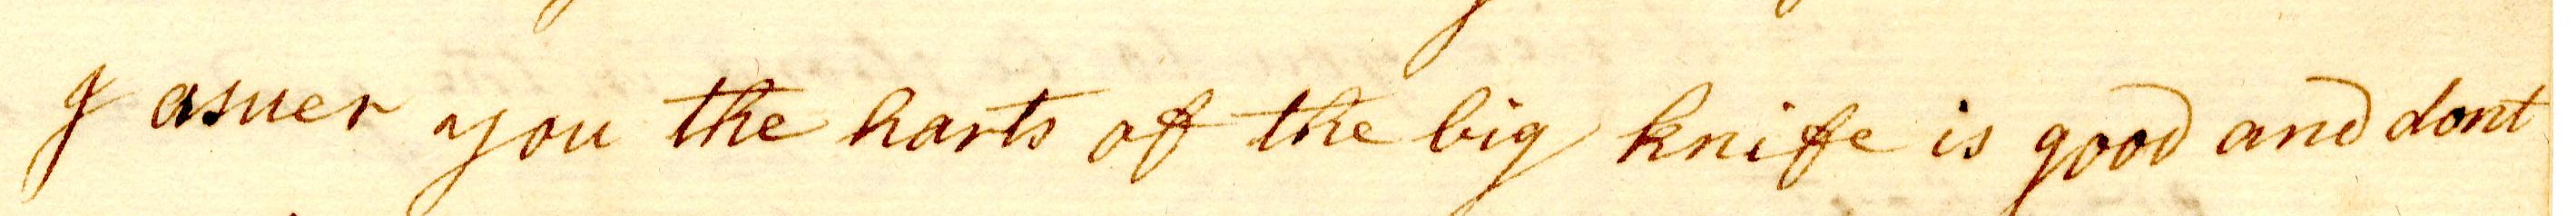I asuer you the harts of the big knife is good and dont
